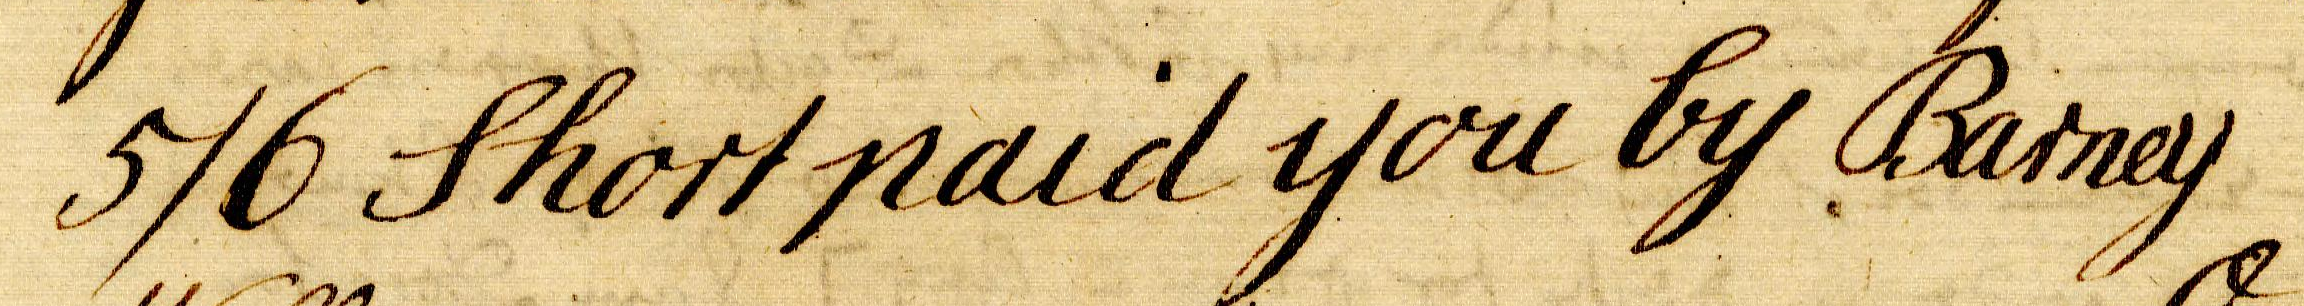5s6 Short paid you by Barney
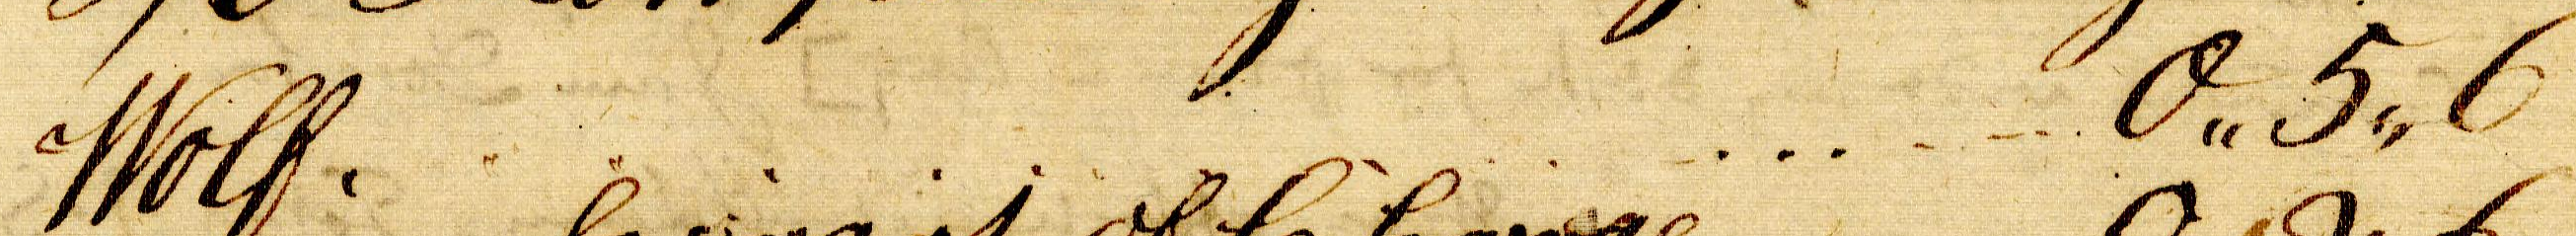Wolf...................00..5..6
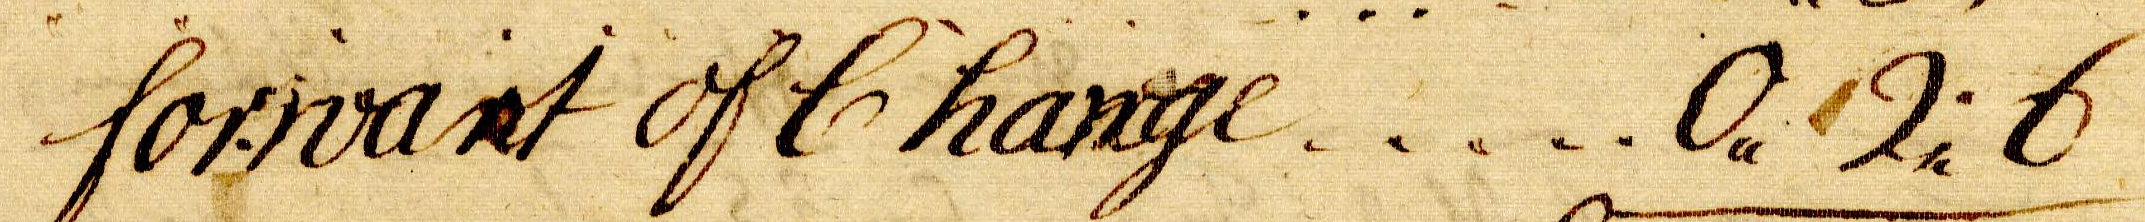for want of Change.....0..2..6
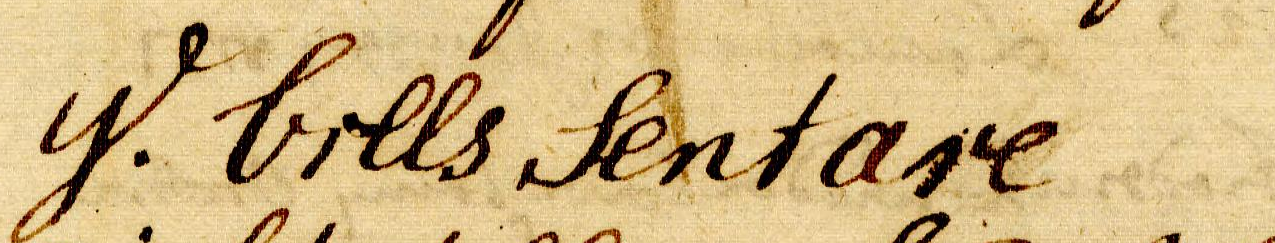y^e. bills Sent are
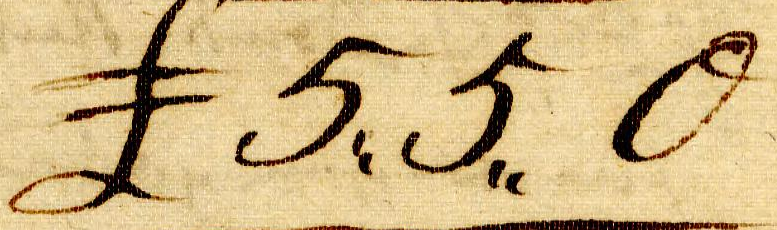£5..5..0
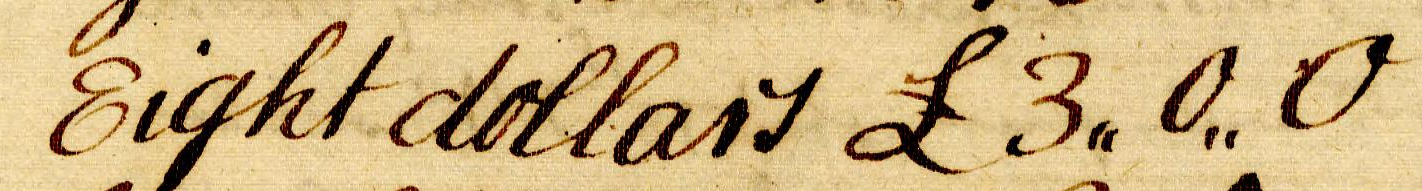Eight dollars £3..0..0
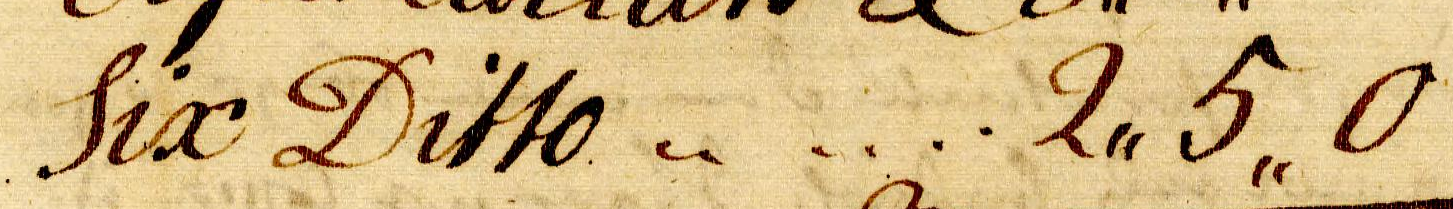Six Ditto......2..5..0
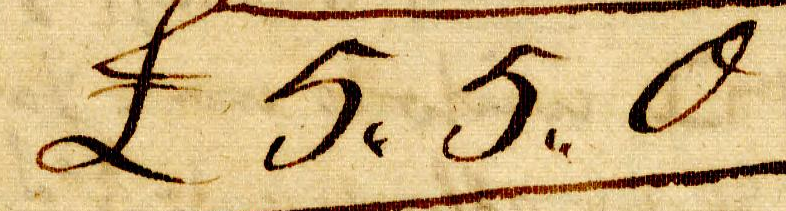£5..5..0
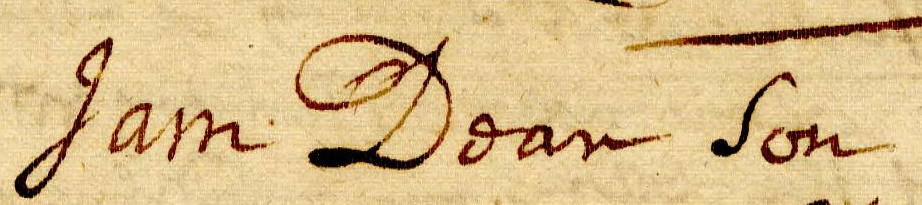I am Dear Son
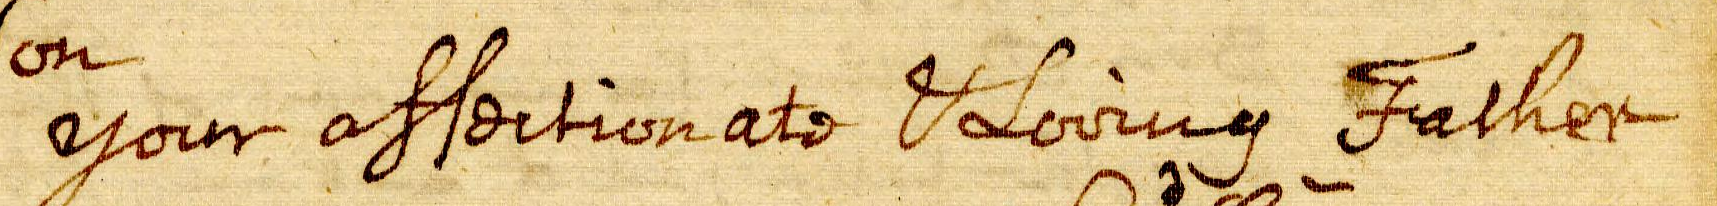Your affectionate & Loving Father
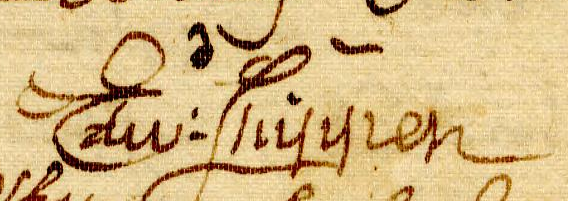Edw:^d Shippen
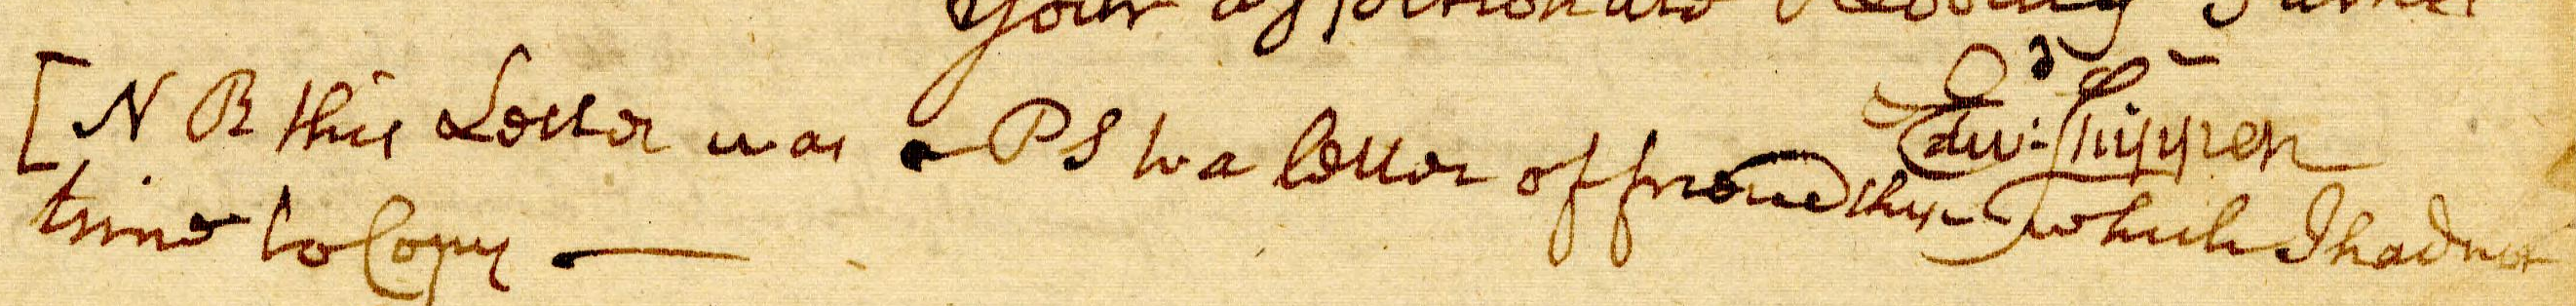[N B this Letter was a PS to a letter of friend thy- which I had not
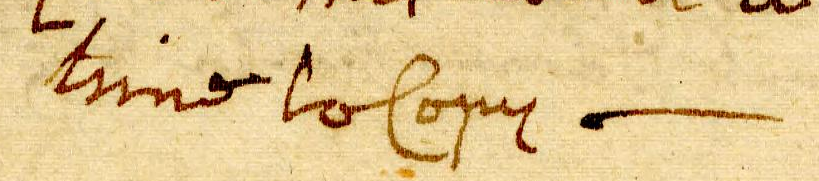time to Copy-
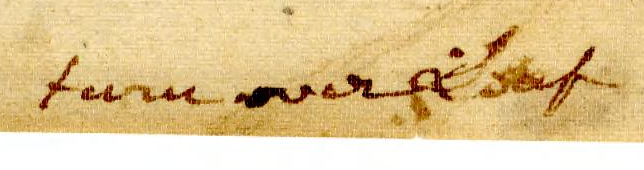turn over Leaf
